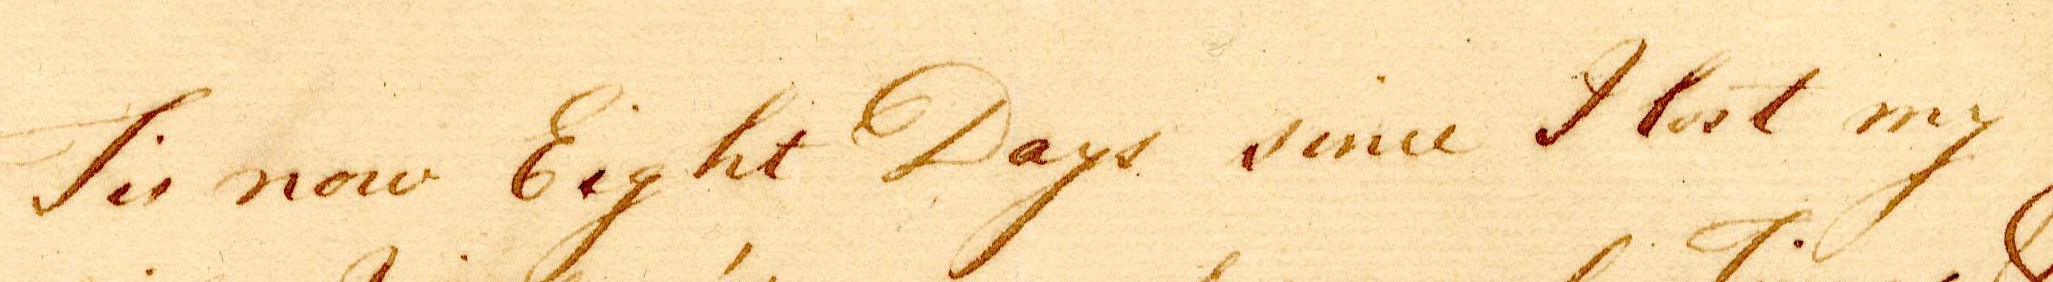Tis now Eight Days since I lost my
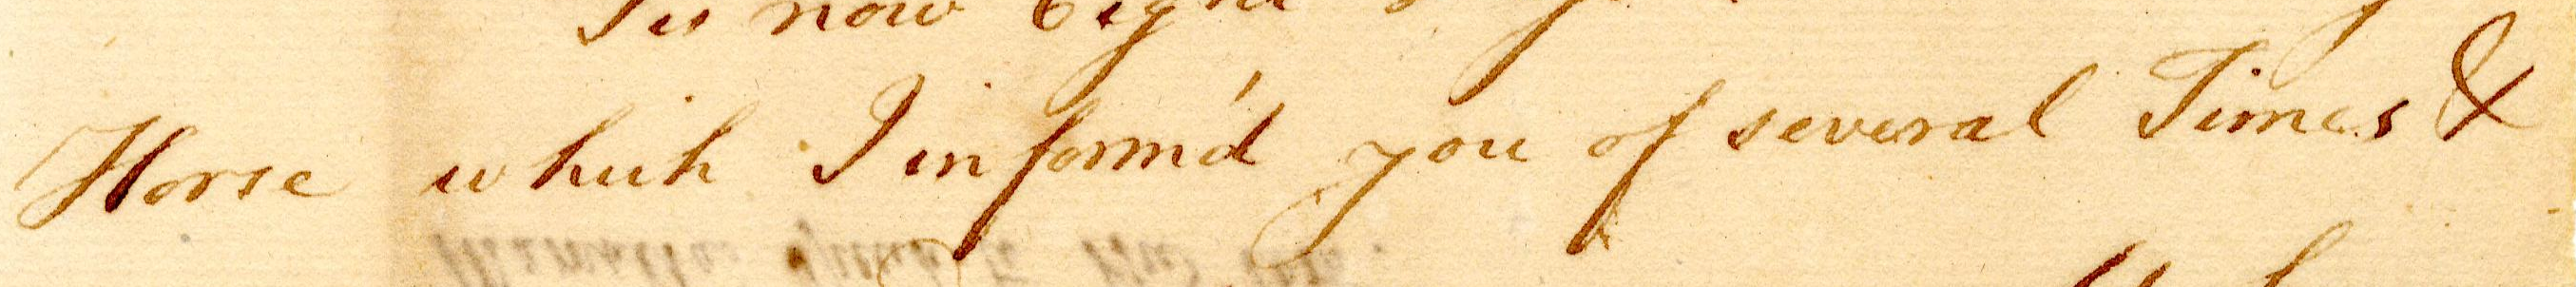Horse which I inform'd you of several Times &
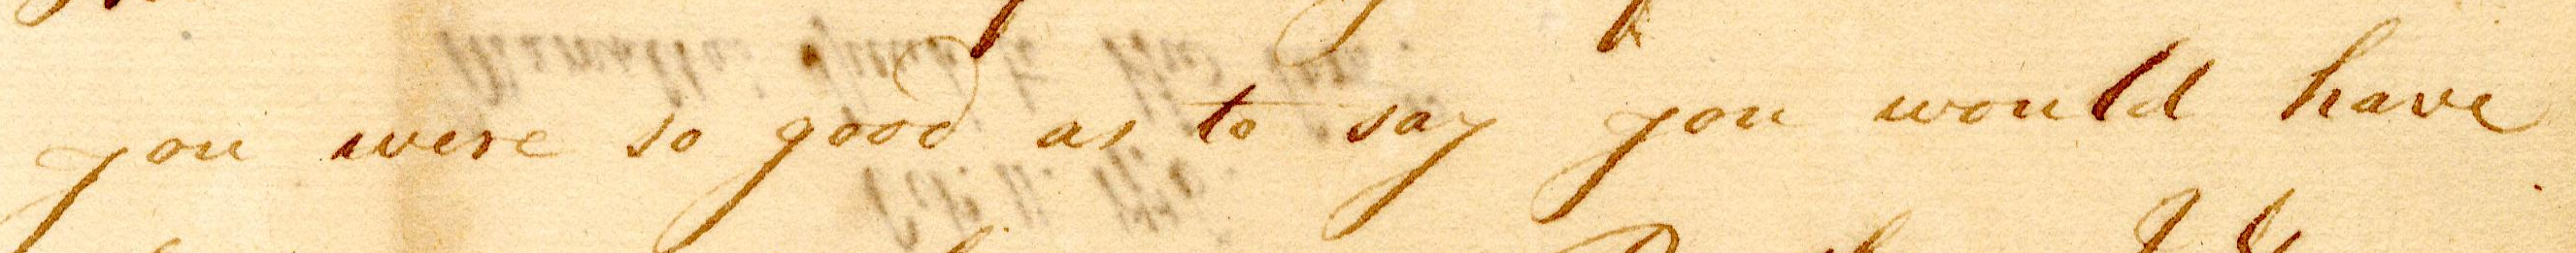you were so good as to say you would have
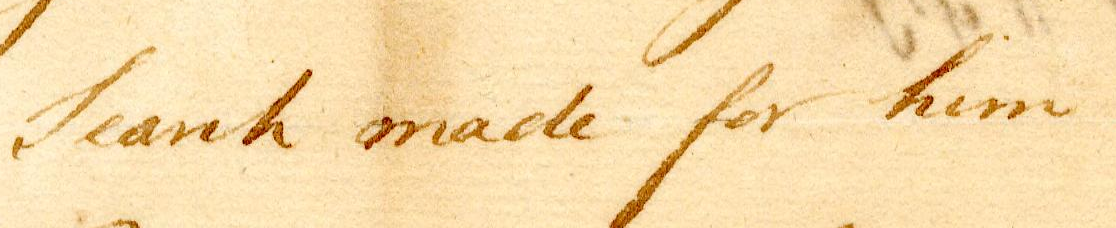search made for him.
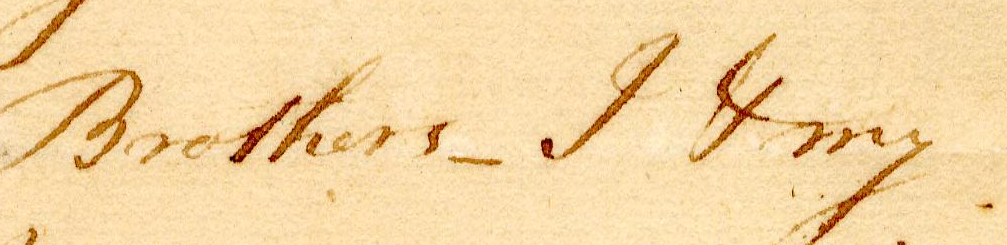Brothers- I & my
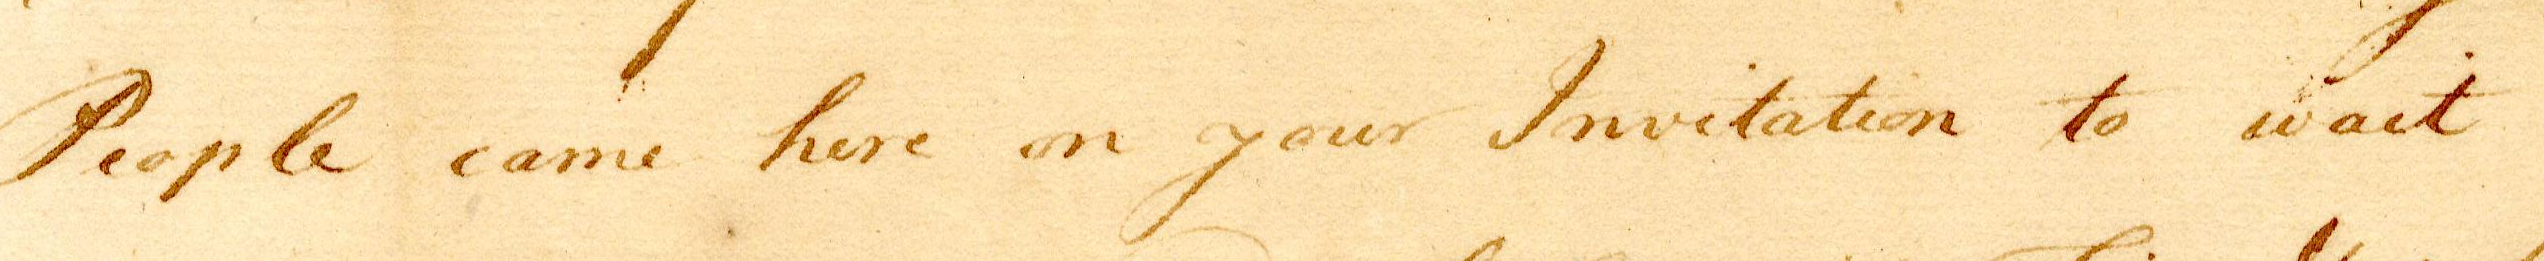People came here on your Invitation to wait
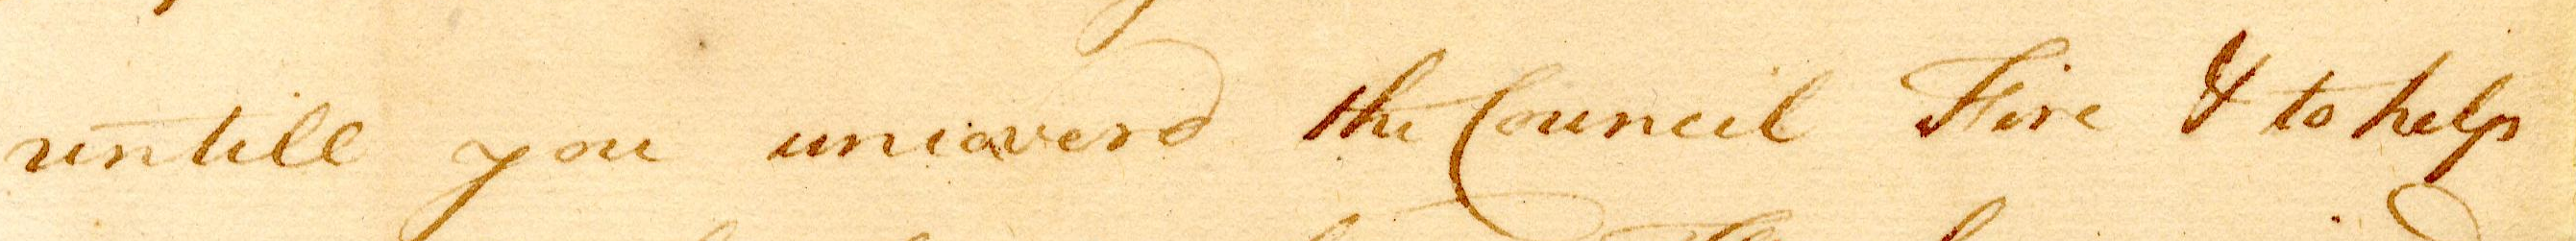untill you uncoverd the Council Fire & to help
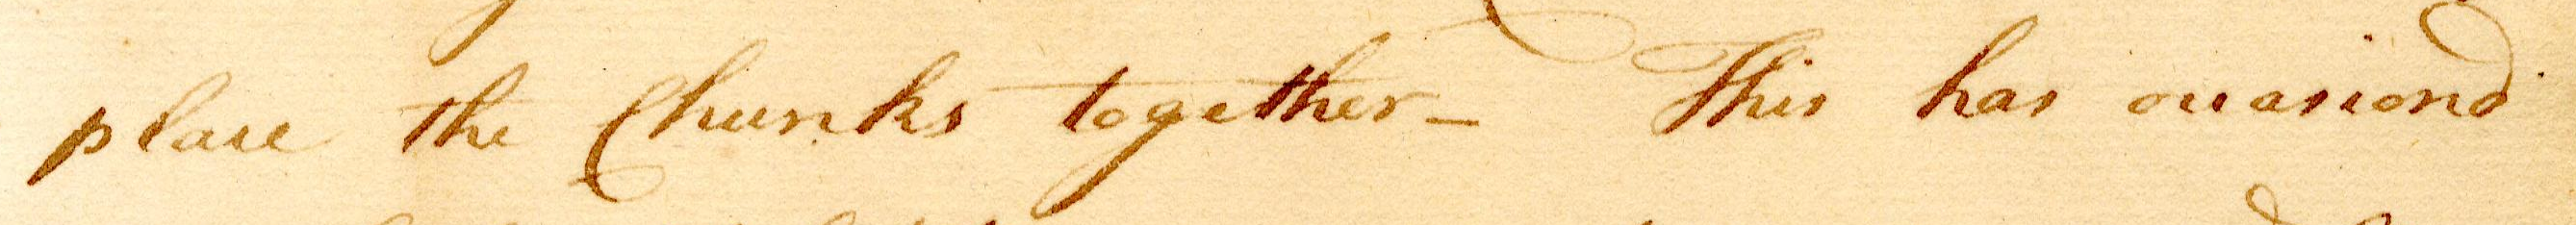place the Chunks together- This has occasiond
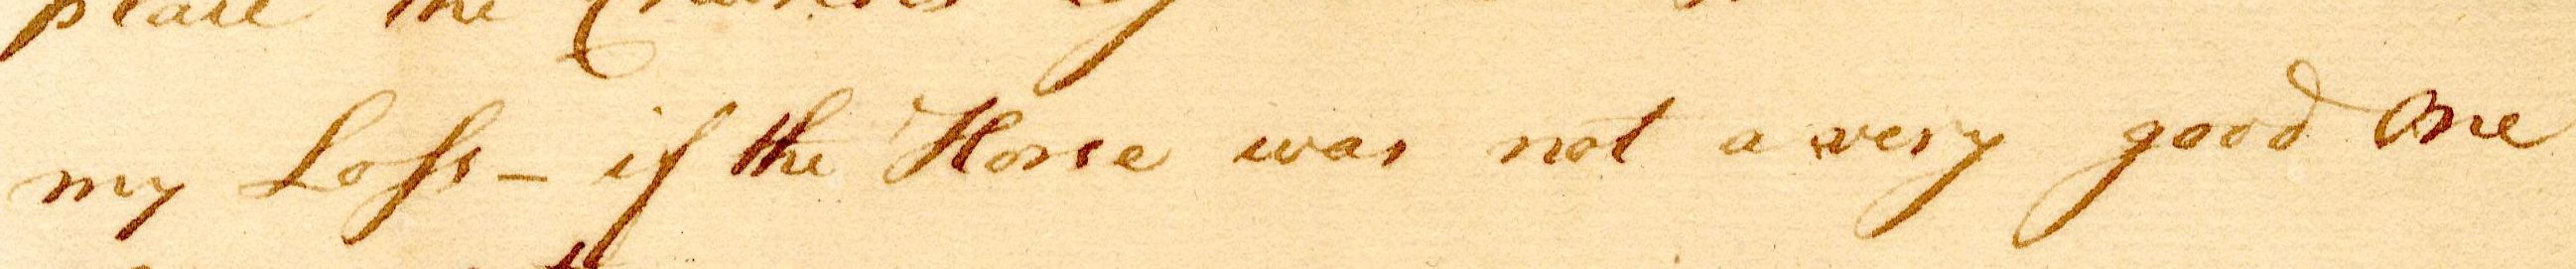my Loss- if the Horse was not a very good one
